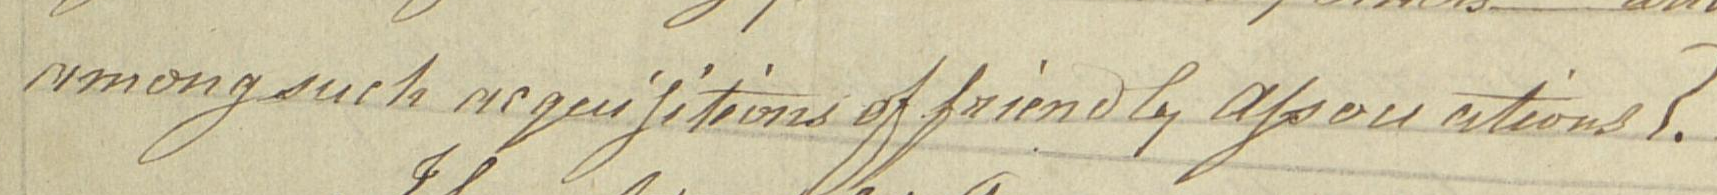among such acquisitions of friendly associations?
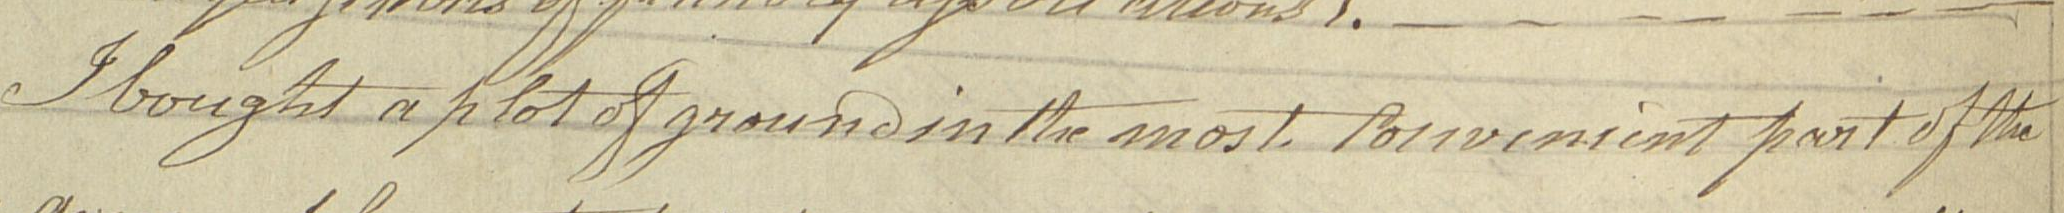I bought a plot of ground in the most Convenient part of the
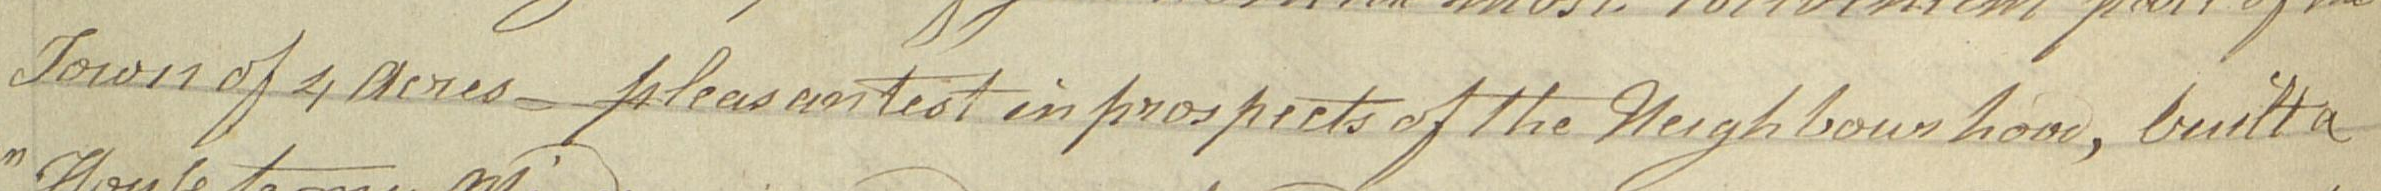Town of 4 Acres pleas contest in prospects of the Neighbourhood, built a
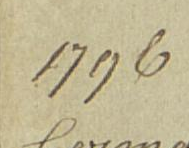1796
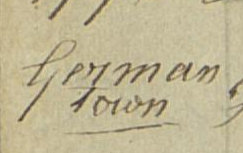German-
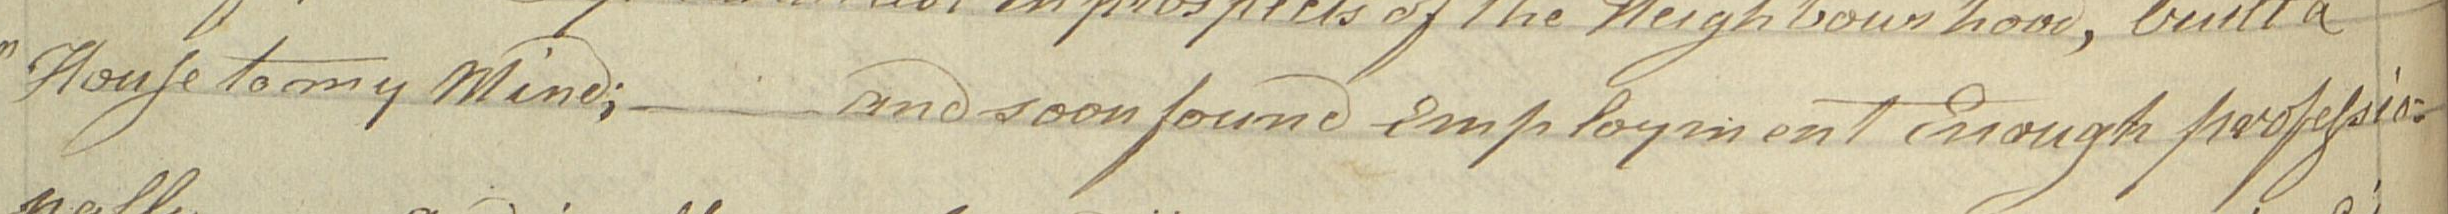House to my Mind; and soon found Employment Enough professio-
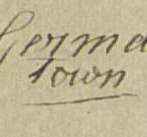-town
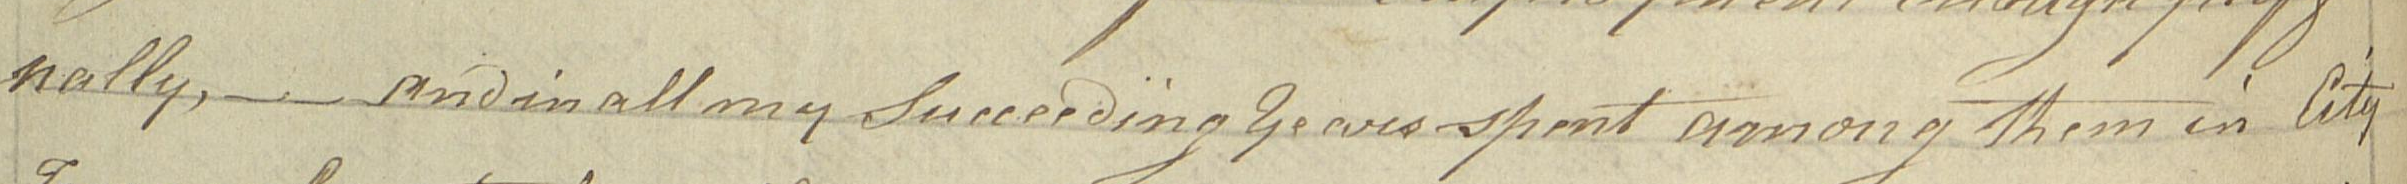-nally, And in all my succeeding Years spent among them in City
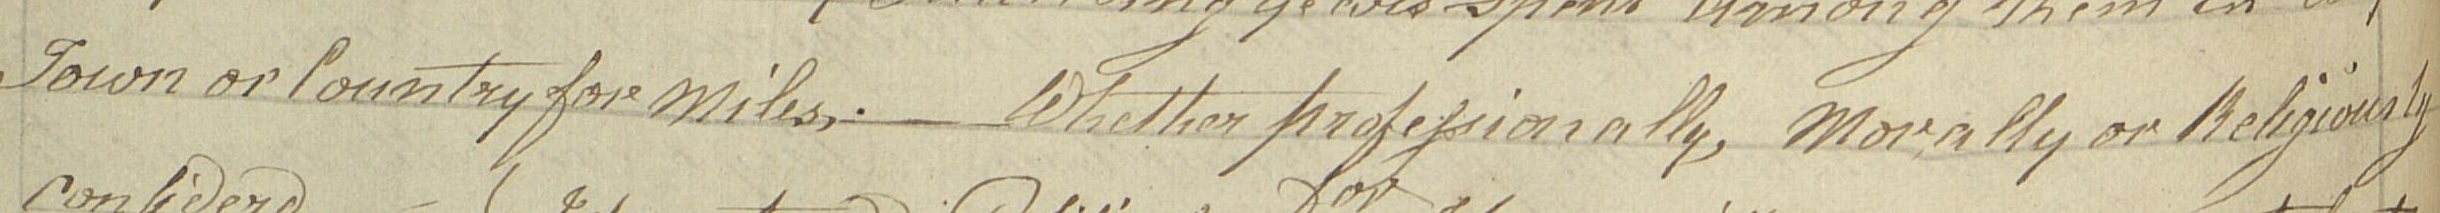Town or Country for Miles, Whether professionally Morally or Religiously
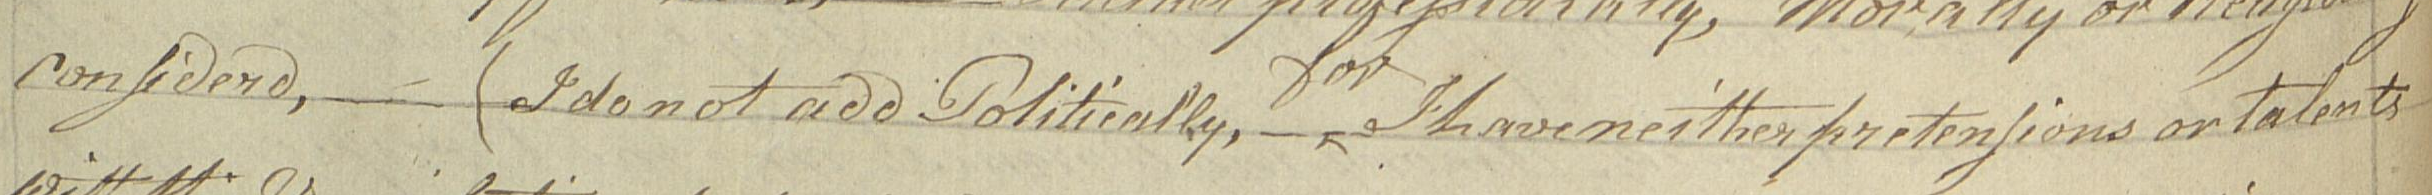Considerd, ( I do not add Politically, ^ I have neither pretensions or talents
